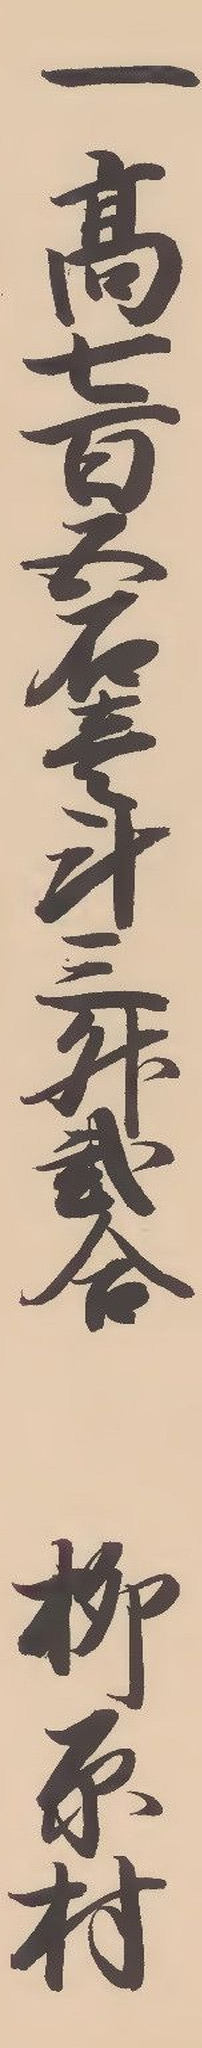一高七百五石壱斗三升弐合柳原村
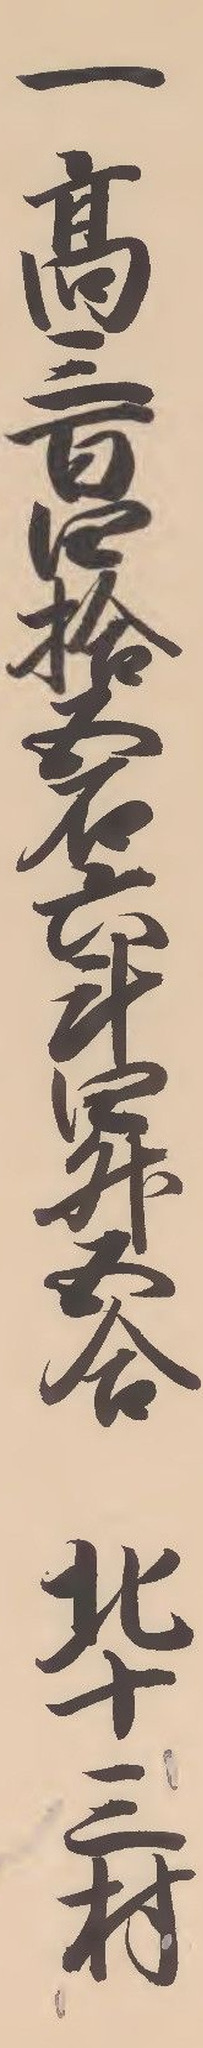一高三百四拾五石六斗四升五合北十三村
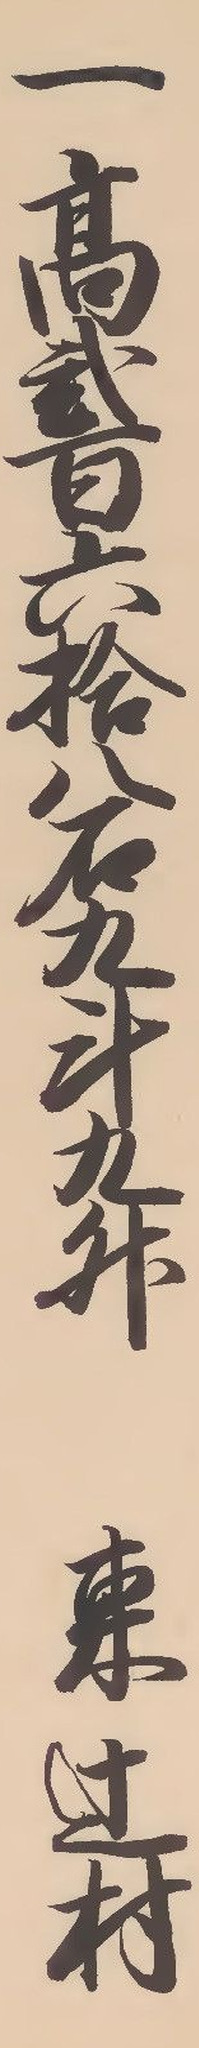一高弐百六拾八石九斗九升東辻村
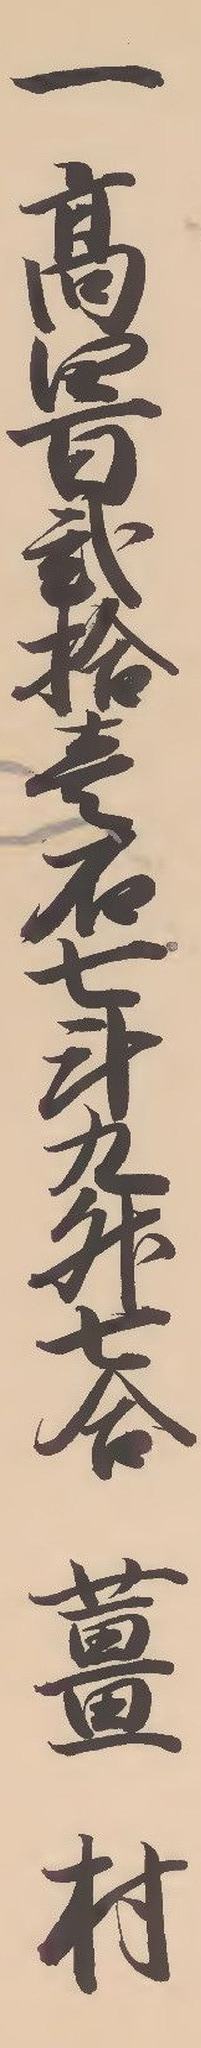一高四百弐拾壱石七斗九升七合薑村

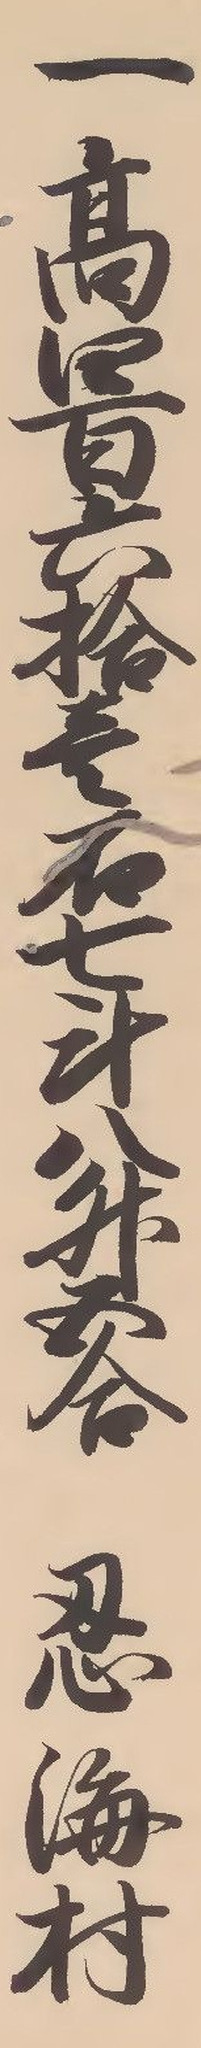一高四百六拾壱石七斗八升五合忍海村
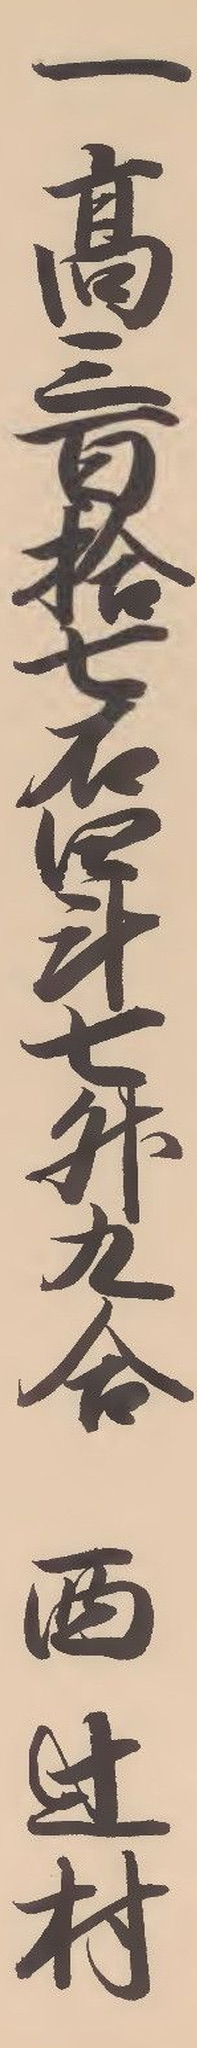一高三百拾七石四斗七升九合西辻村
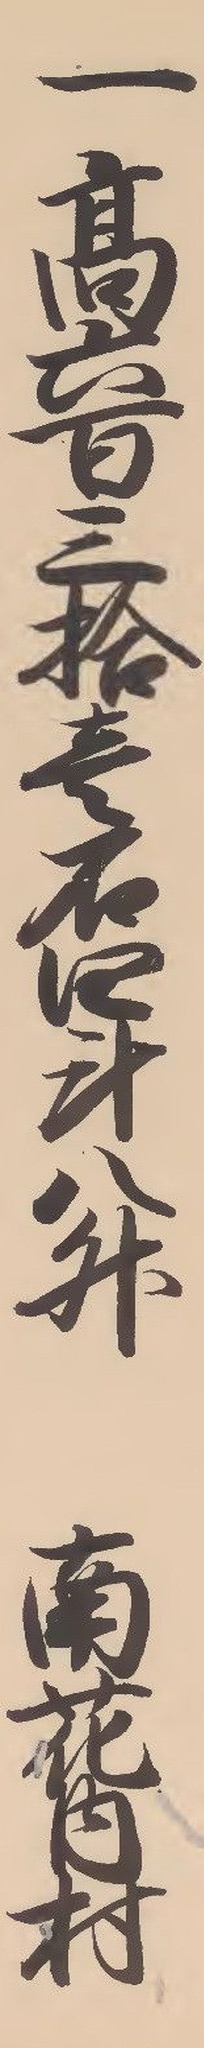一高六百三拾壱石四斗八升南花内村
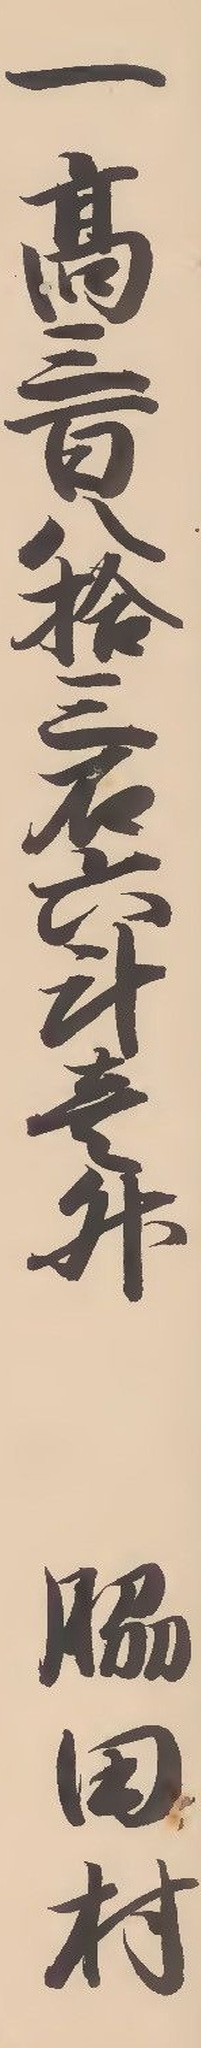一高三百八拾三石六斗壱升脇田村
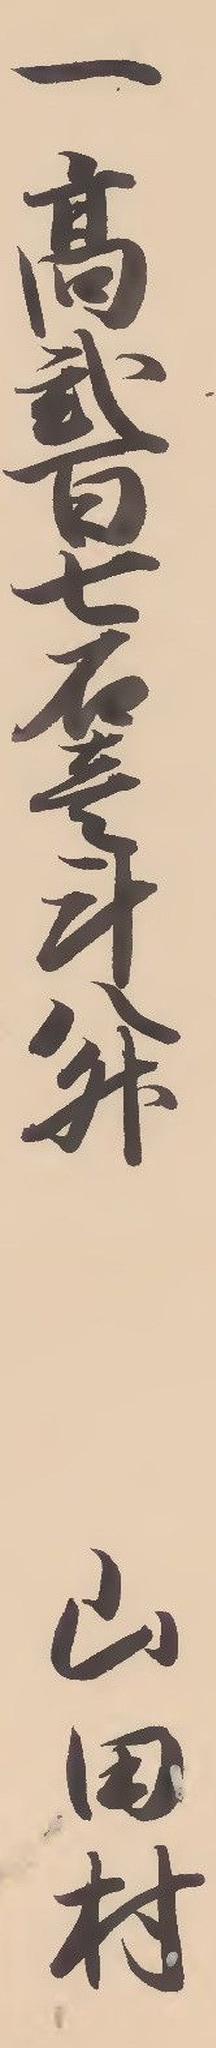一高弐百七石壱斗八升山田村
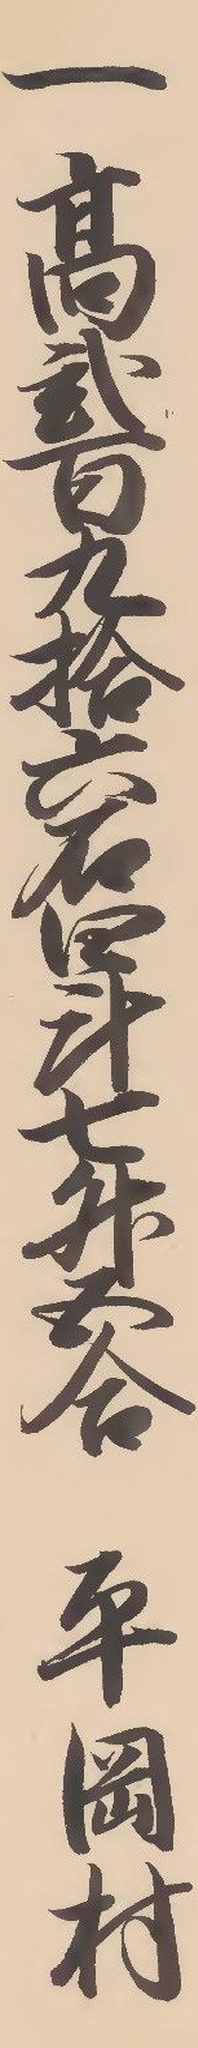一高弐百九拾六石四斗七升五合平岡村
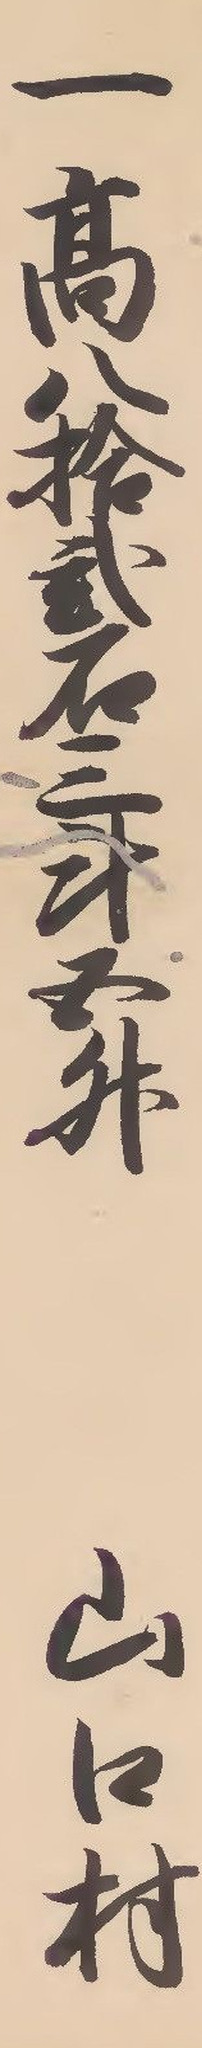一高八拾弐石三斗五升山口村

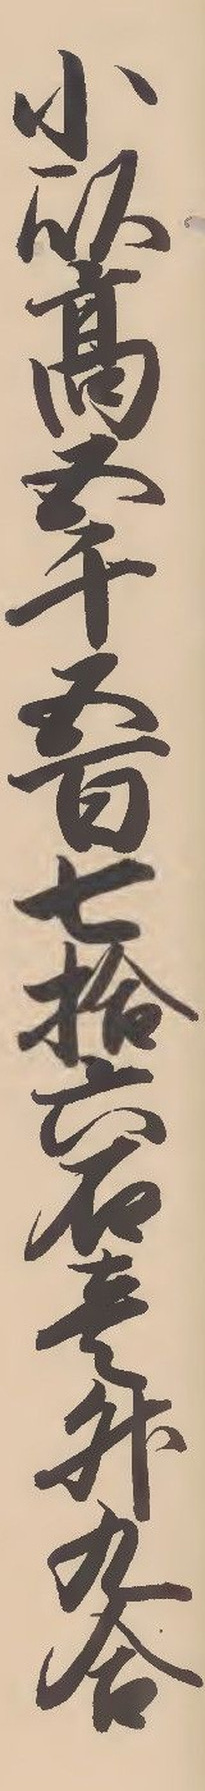小以高五千五百七拾六石壱升九合

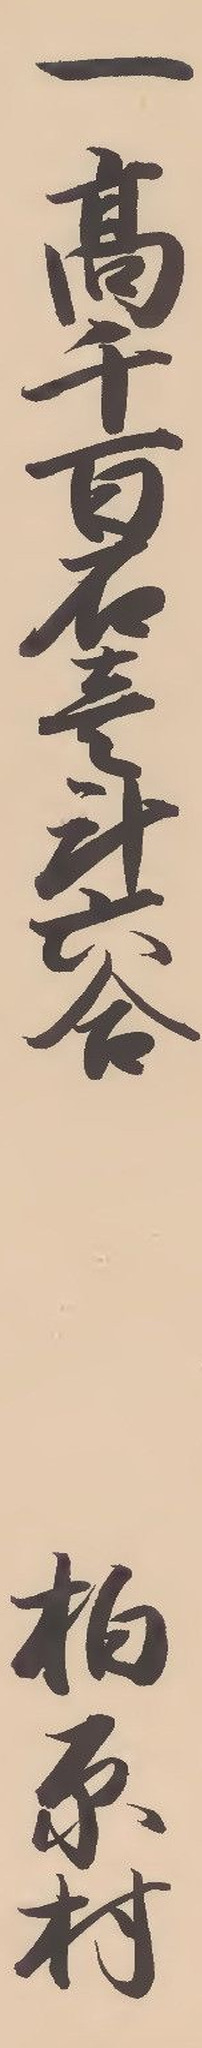一高千百石壱斗六合柏原村
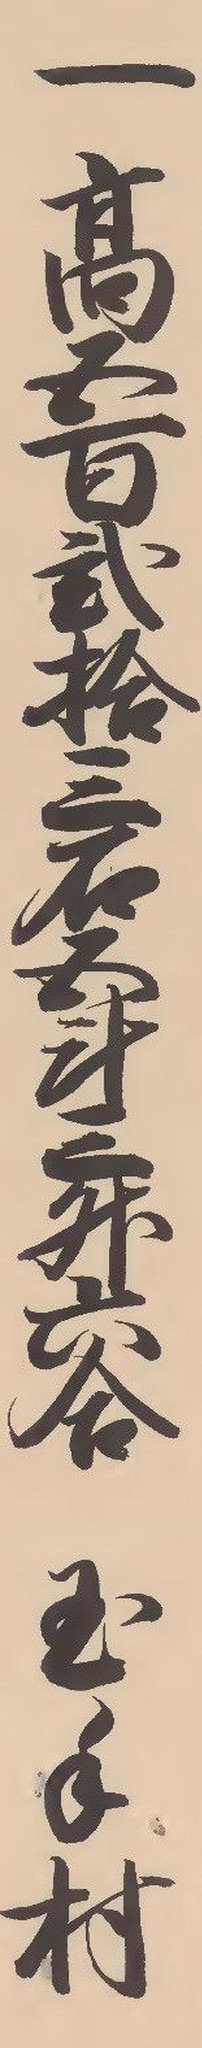一高五百弐拾三石五斗三升六合玉手村
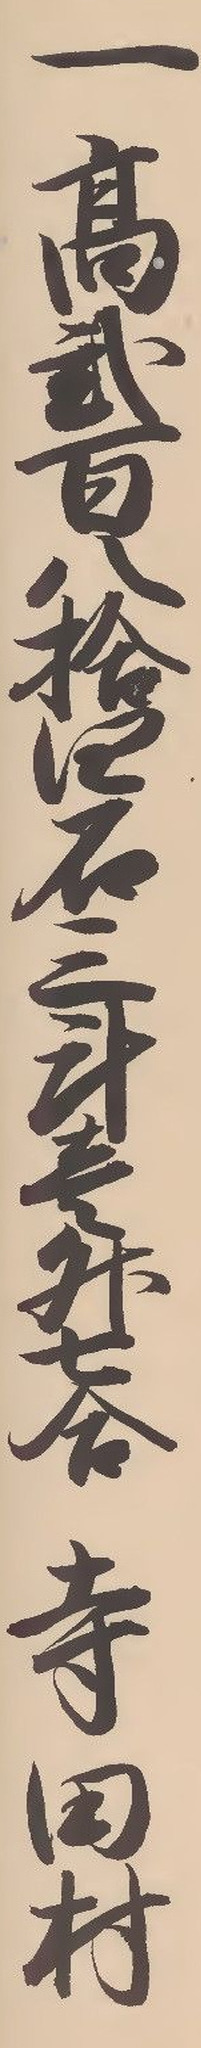一高弐百八拾四石三斗壱升七合寺田村
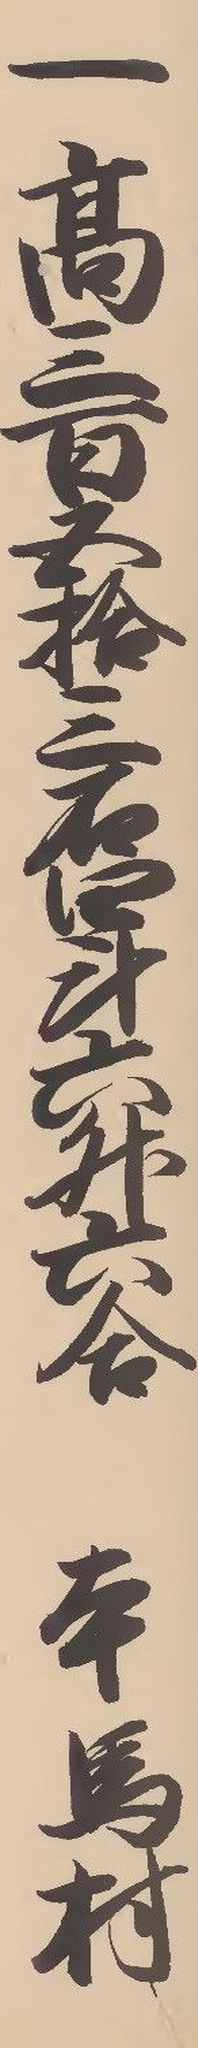一高三百五拾三石四斗六升六合本馬村
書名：大和国郷帳
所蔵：国立公文書館 National Archives of Japan
